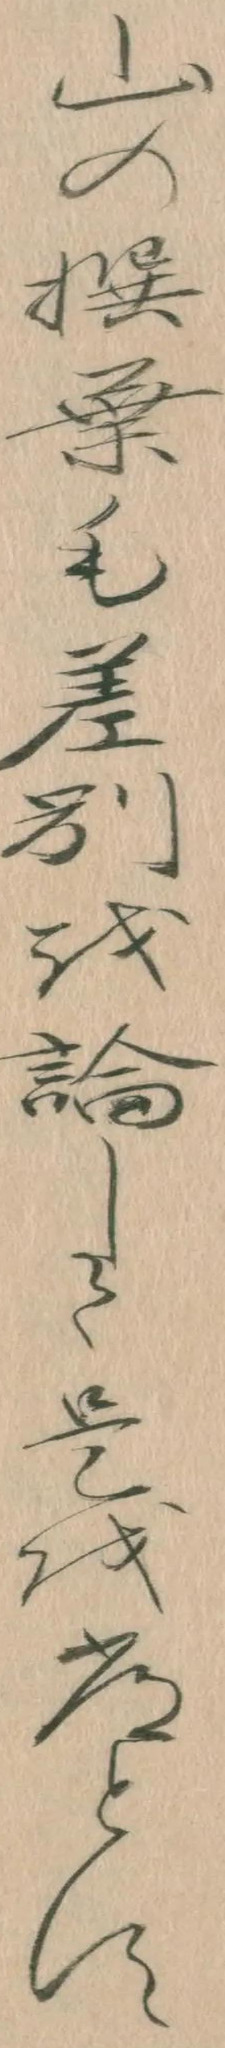山の撰葉も差別を論して是を常とす
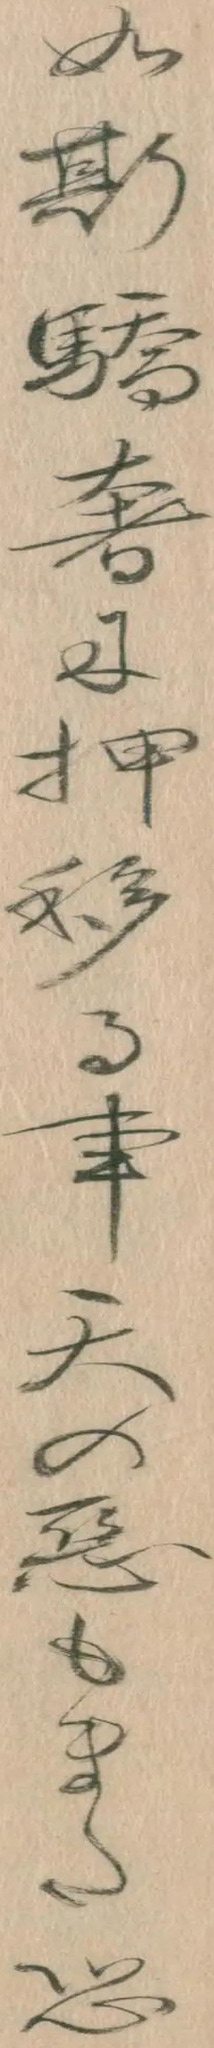如斯驕奢に押移る事天の悪もまた恐
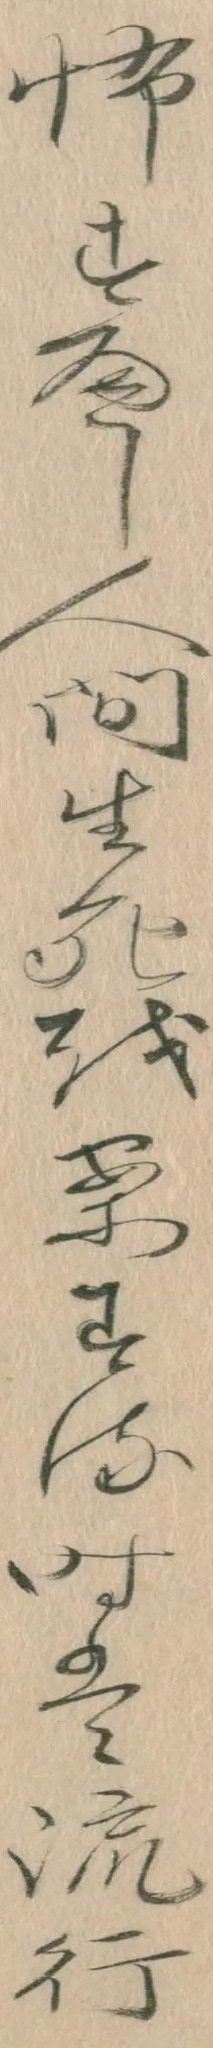怖すへし人間生死を案する時は流行
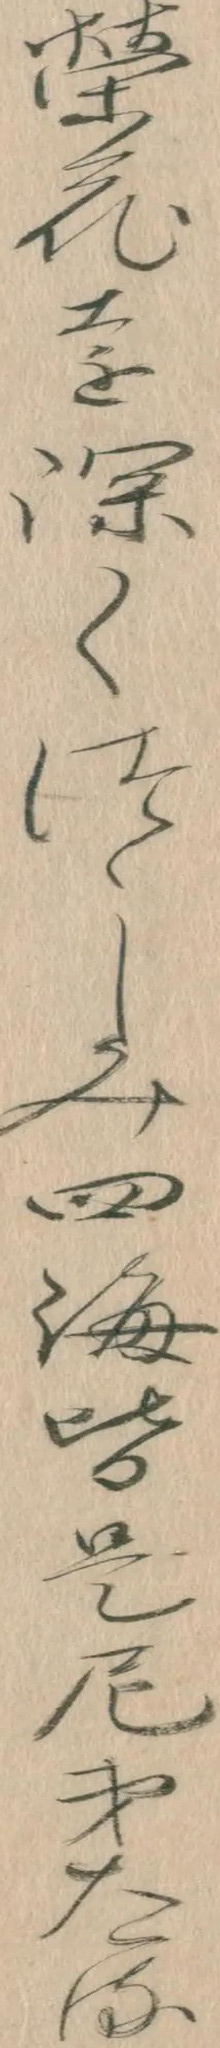栄花を深くつゝしみ四海皆是兄弟たる
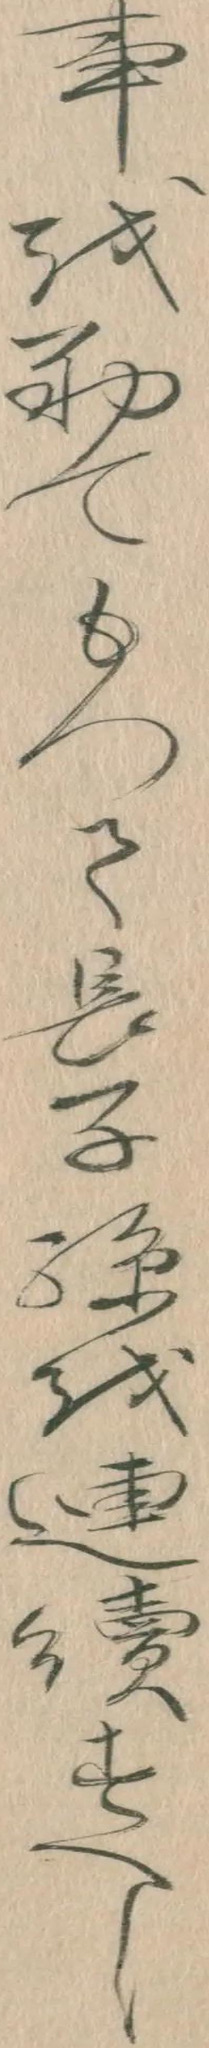事を勤てもつて長子孫を連続すへし
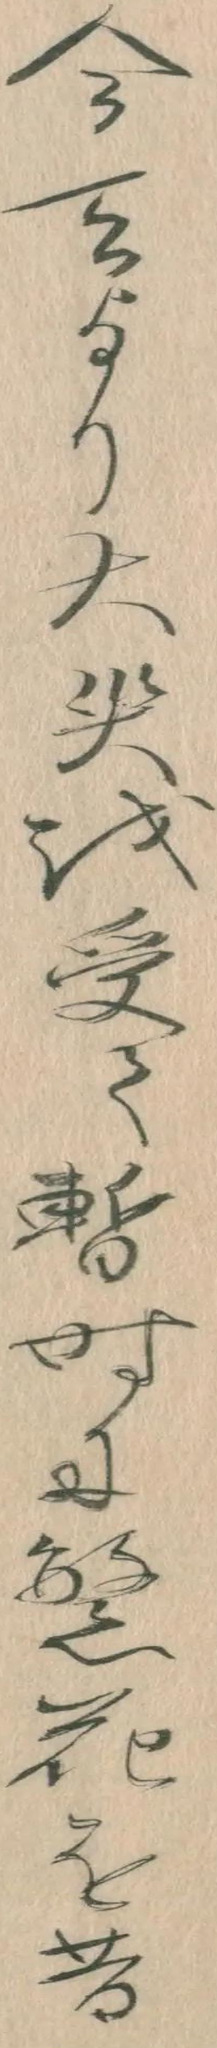今天より大災を受て暫時に繁花を昔
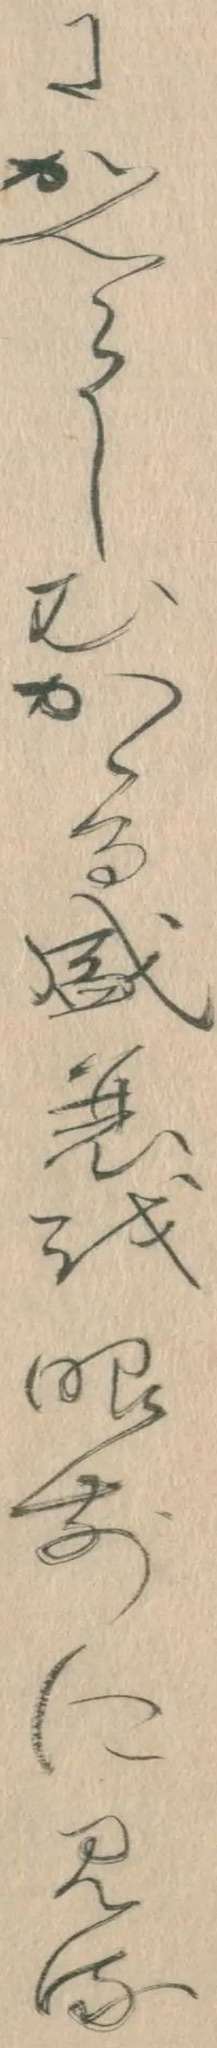にかへらしむかゝる盛衰を眼前に見る
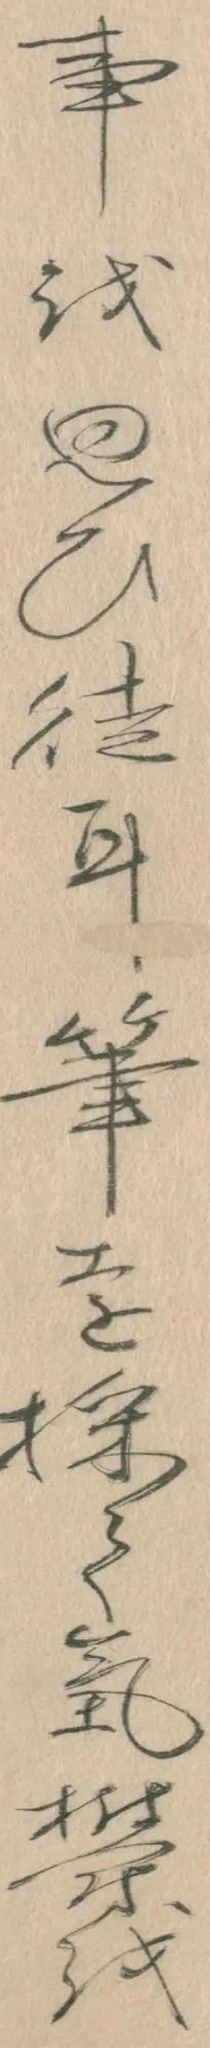事を思ひ徒に筆を採て気欝を
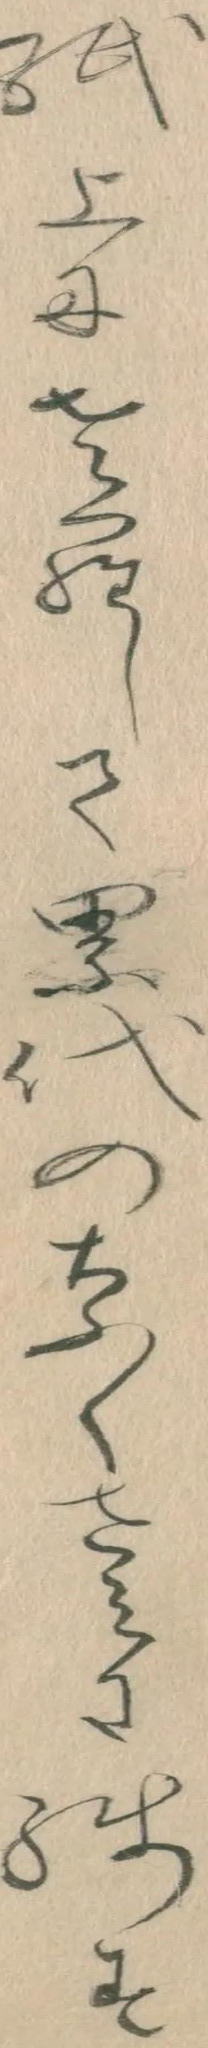紙上にさらして累代のなくさみに残す

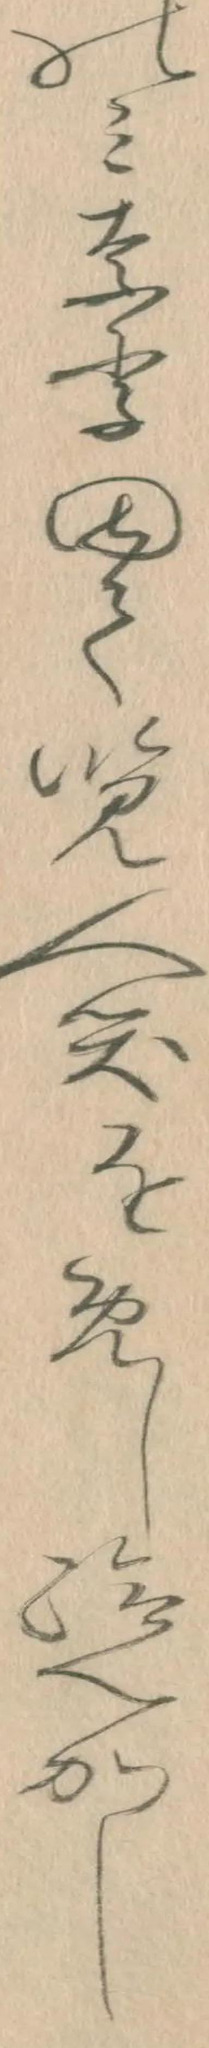のみなり因て覧人笑を免し給へかし
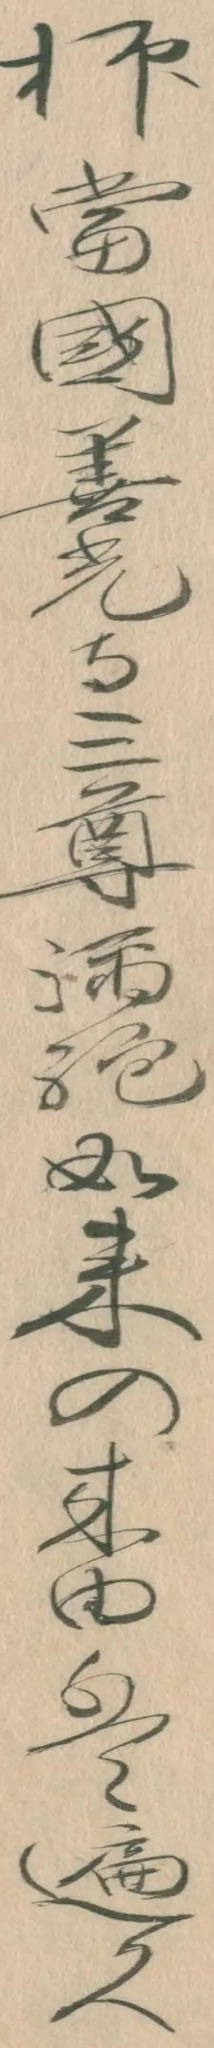抑当国善光寺三尊弥陀如来の来由は遍く
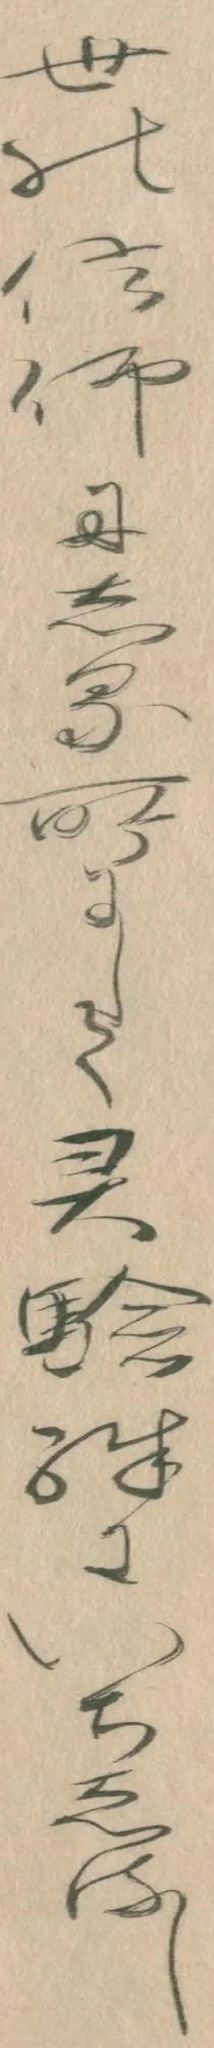世の信仰にしる所にして霊験殊にいちしるし
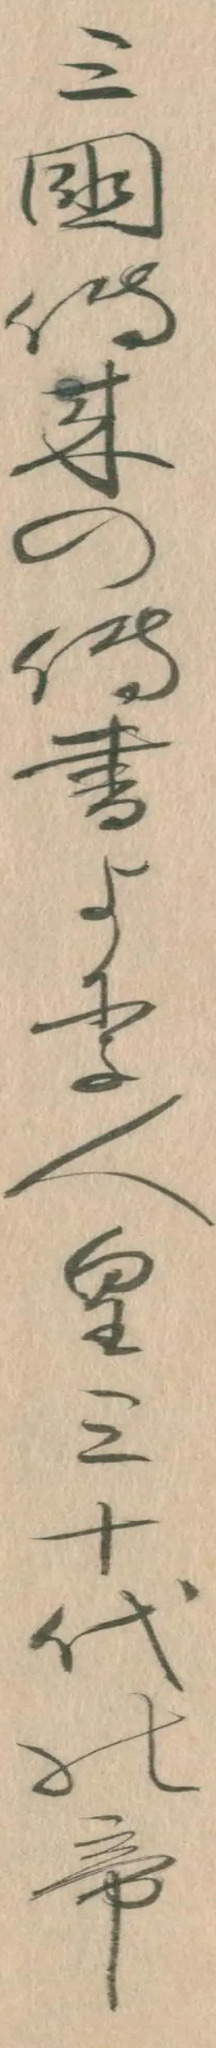三国伝来の伝書より人皇三十代の帝
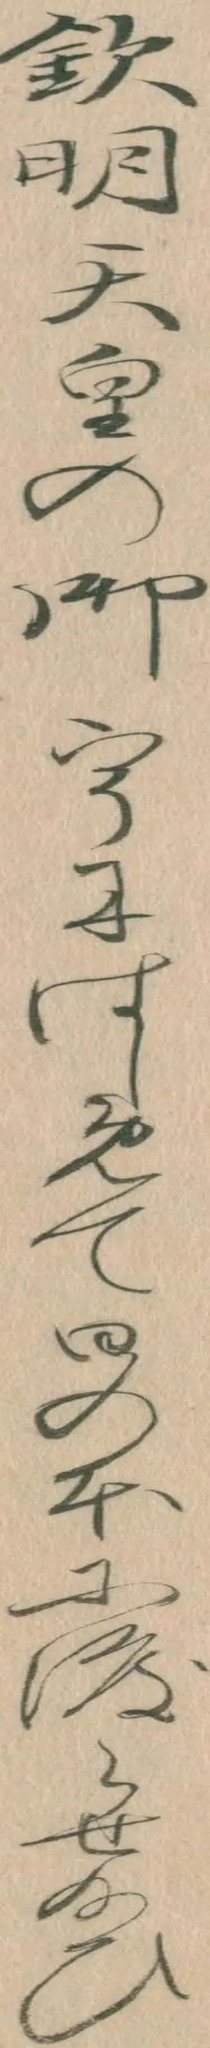欽明天皇の御宇にはしめて日の本に渡らせ給ひ
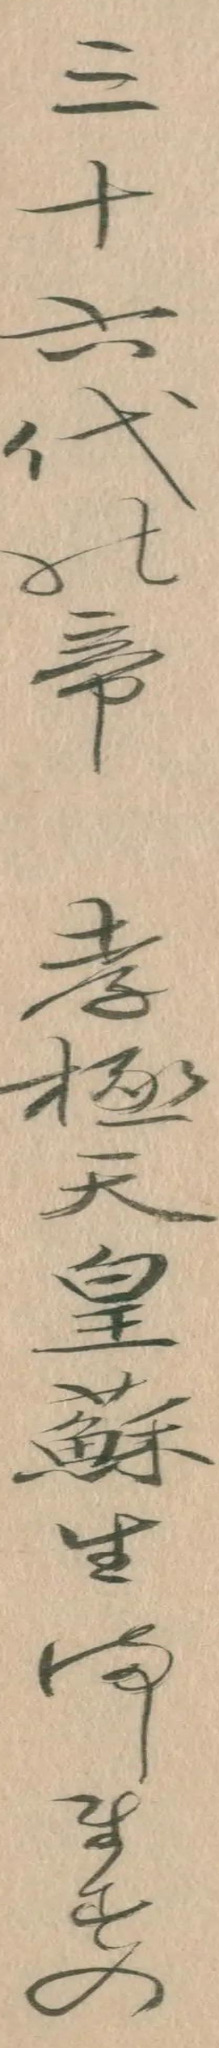三十六代の帝孝極天皇蘇生ましますの
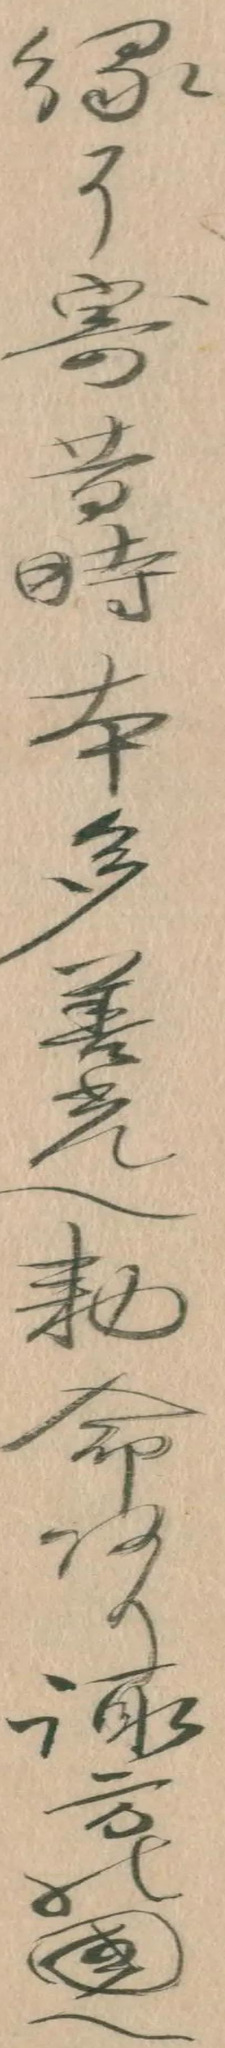縁に寄昔時本多善光へ勅命あり諏方の国へ
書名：俗語之種. [1]
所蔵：国立国会図書館 National Diet Library, JAPAN
